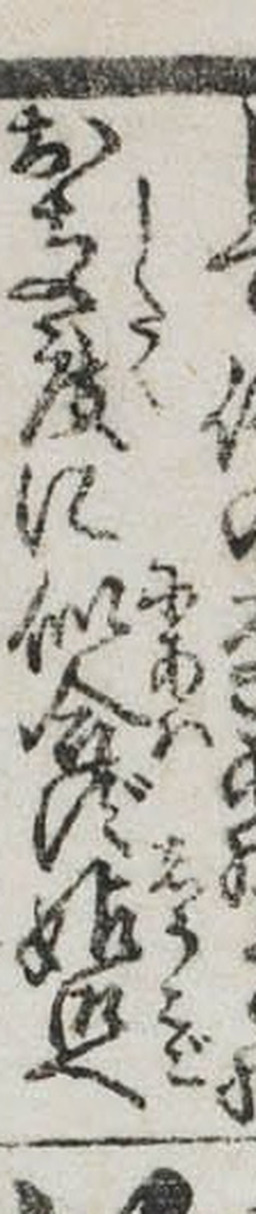お支度に似合ず姑御へ
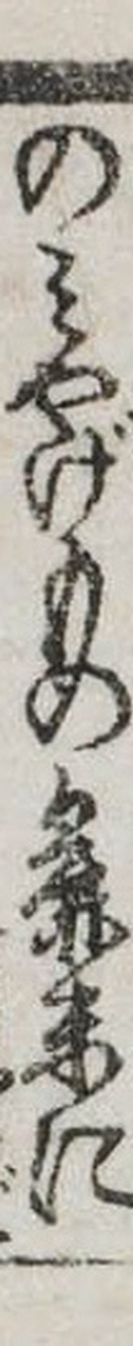のみやげもの麁末に
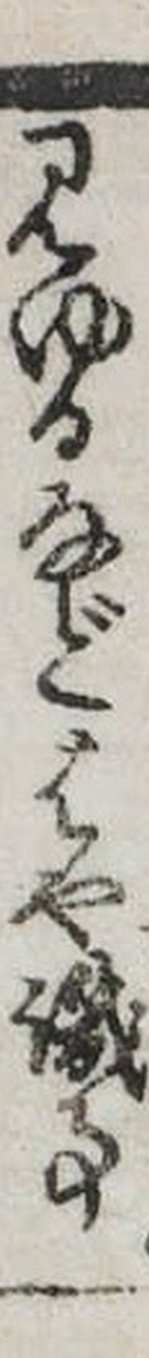見ゆるなどはや譏事
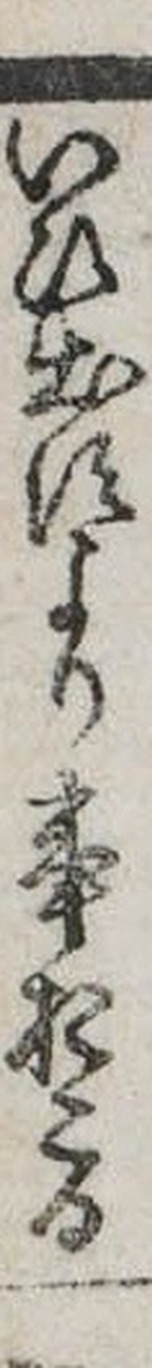いひ出すより事おこる
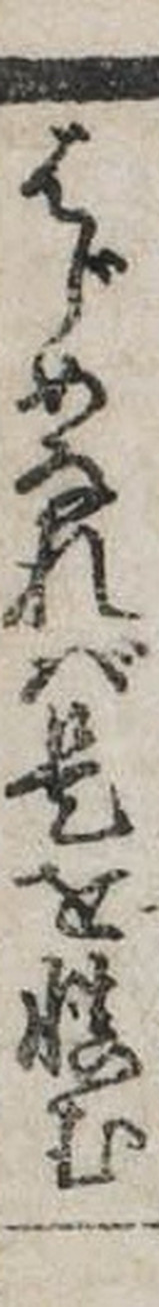はじめなればこれを慎む

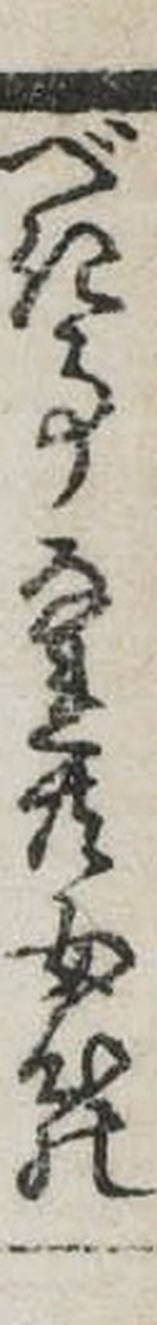べき事なれ共女心の
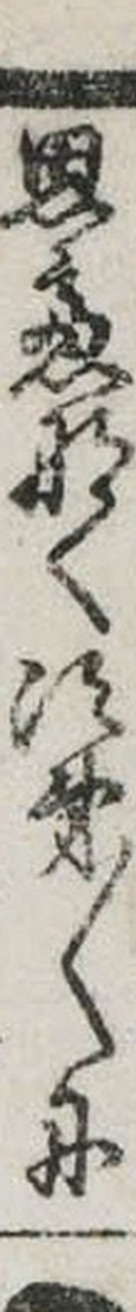思慮なく次第〳〵に
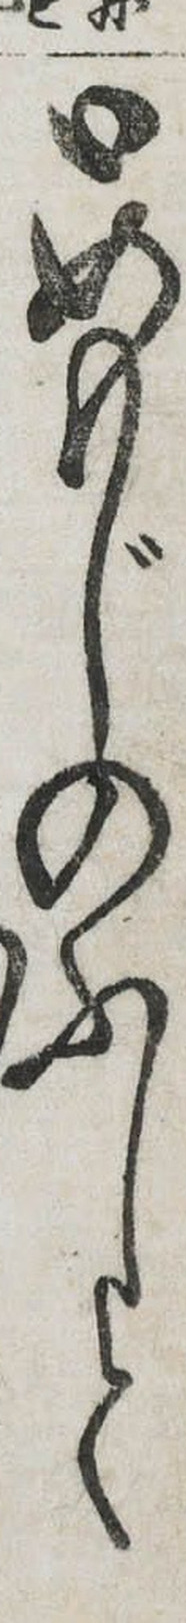御めもじのふしと
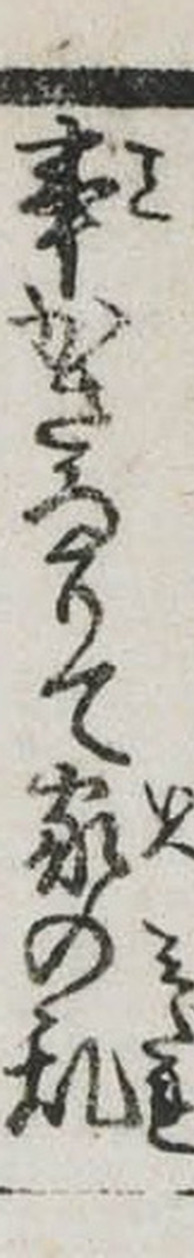事かさなりて家の乱
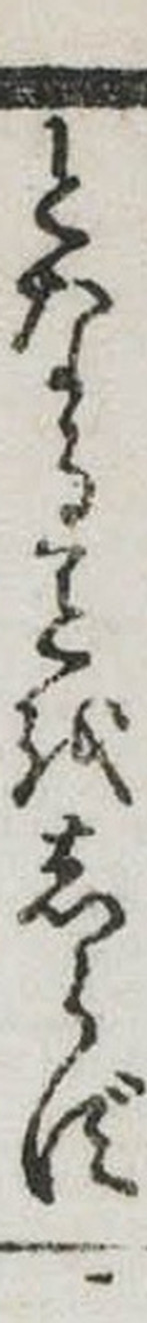となることをしらず
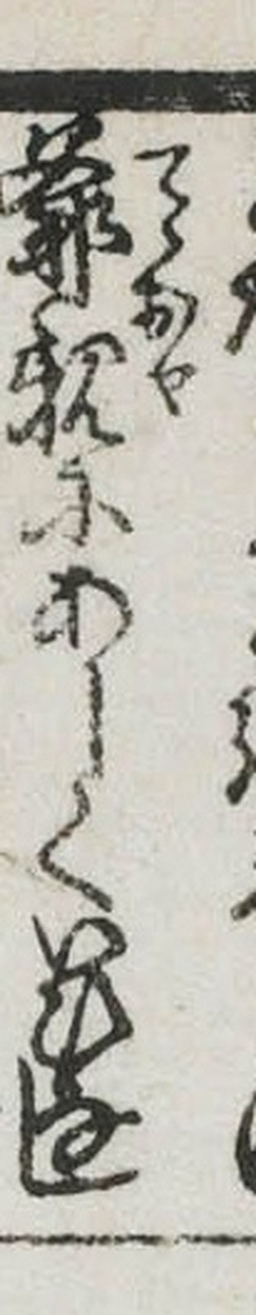爺親にあしくいひなし
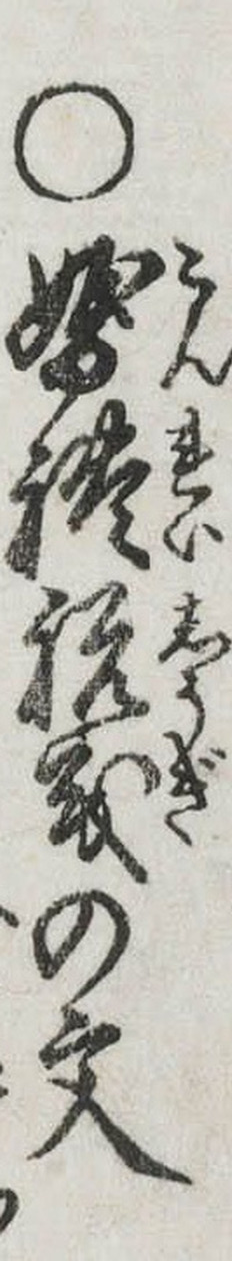○婚礼祝義の文
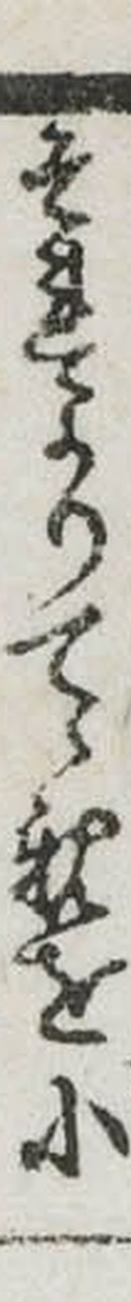それよりてゝ親を小
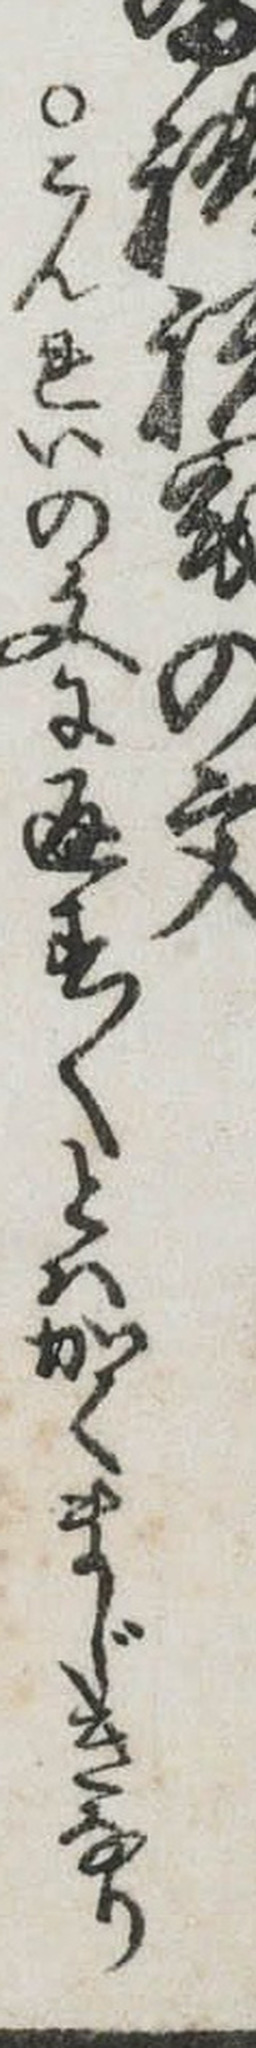○こんれいの文に返す〳〵とはかくまじきなり
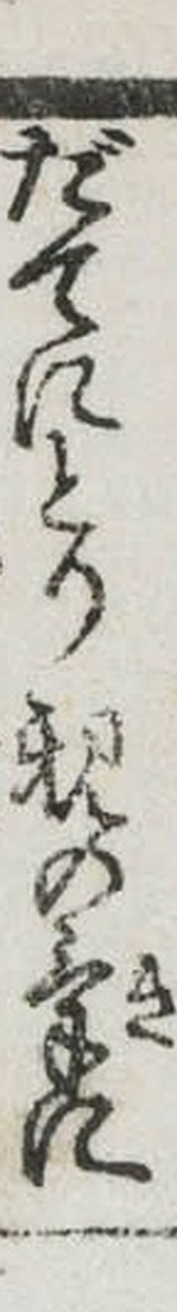だてにとり親の気に
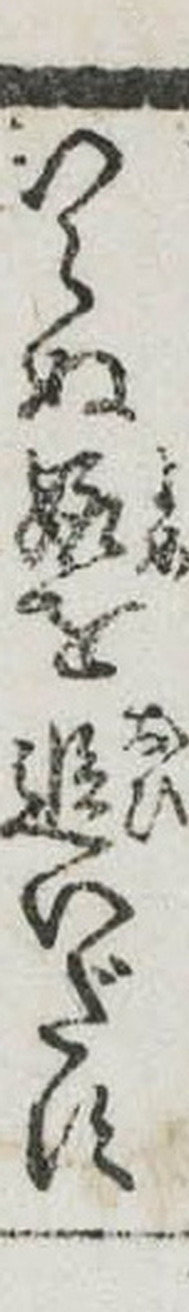いらぬ娵を追いだす
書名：頭書萬用婦人手紙之文言
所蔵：東京学芸大学教育コンテンツアーカイブ
